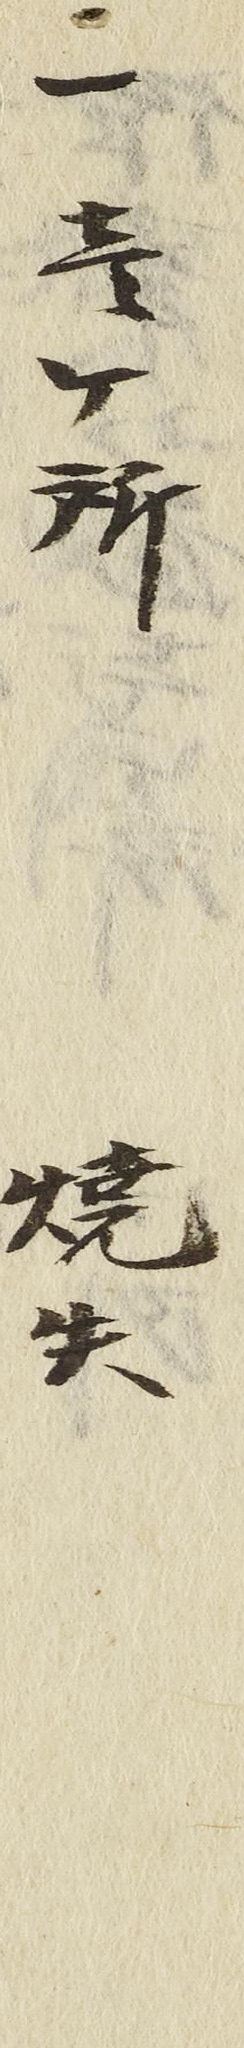一壱ヶ所焼失
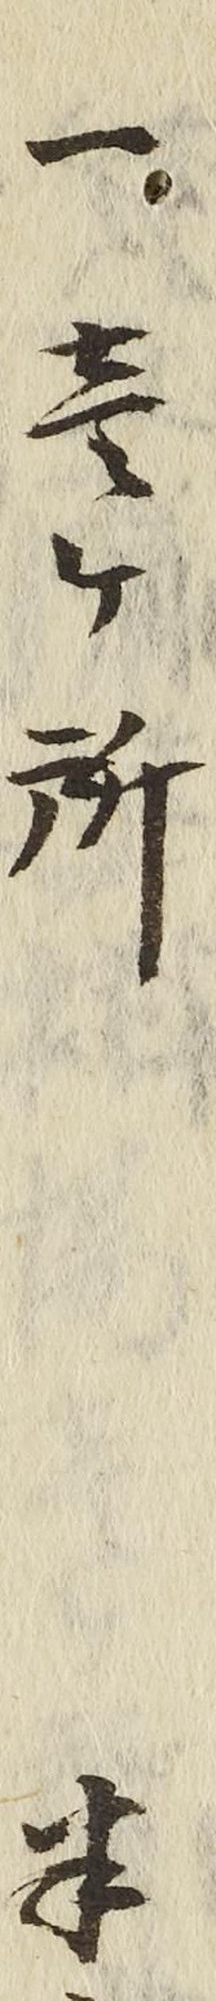一壱ヶ所半潰
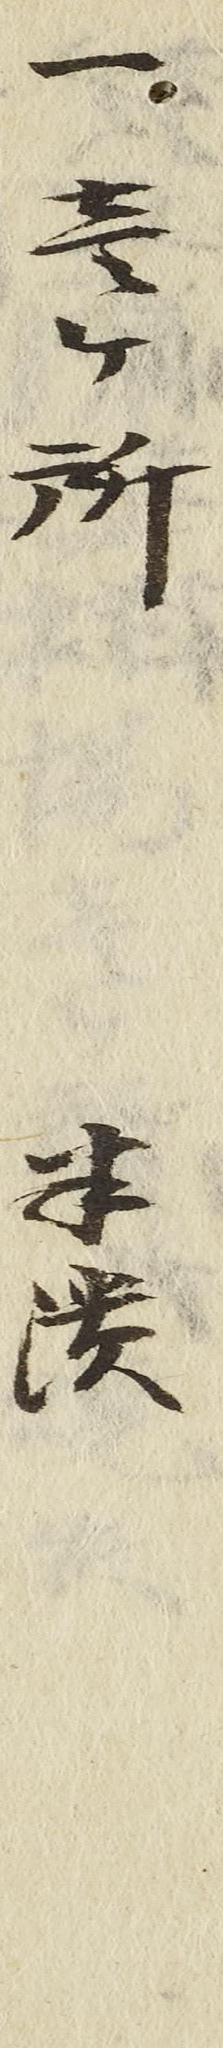一壱ヶ所半潰
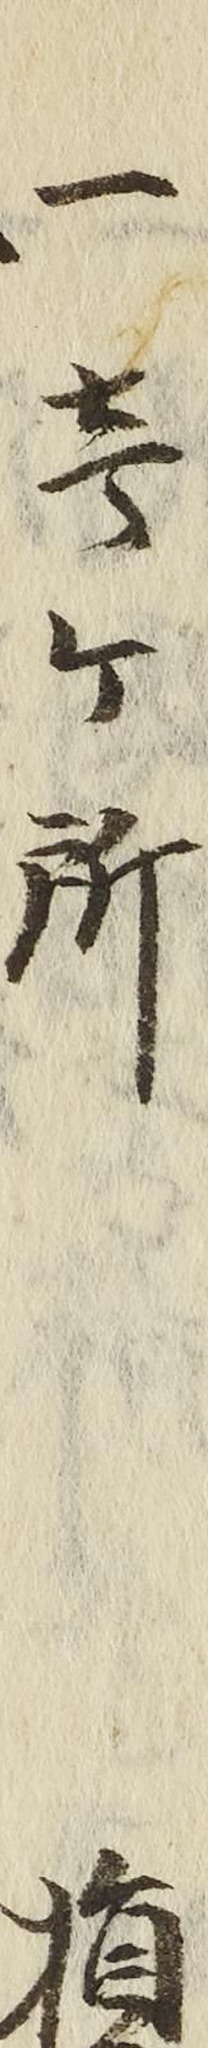一壱ヶ所損
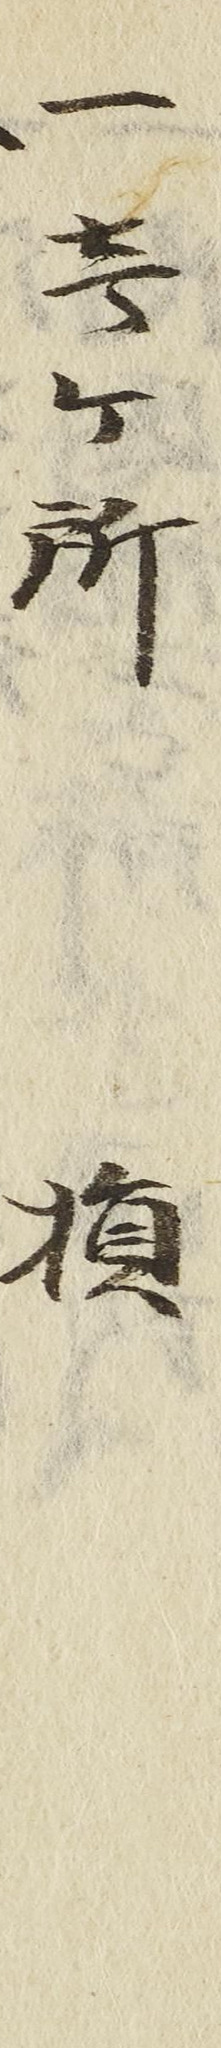一壱ヶ所損
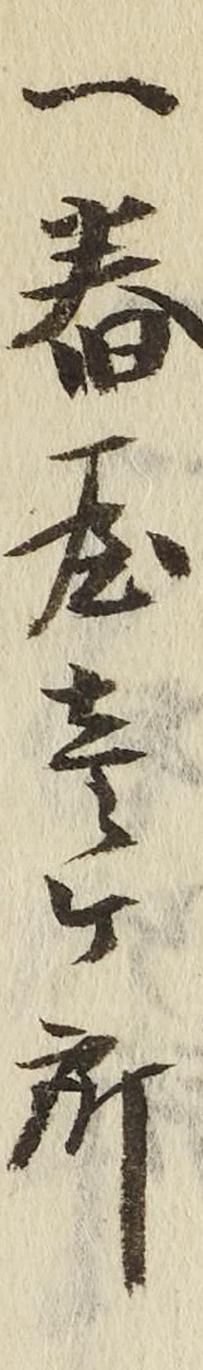一舂屋壱ヶ所潰
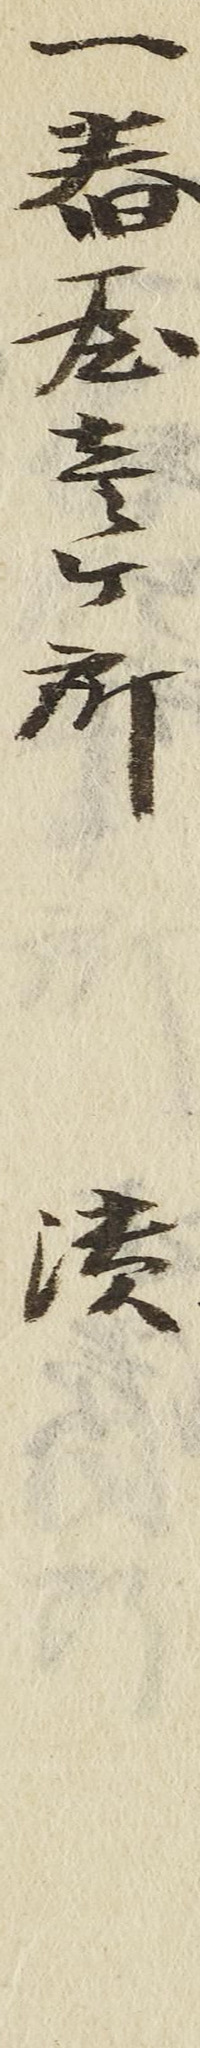一舂屋壱ヶ所潰
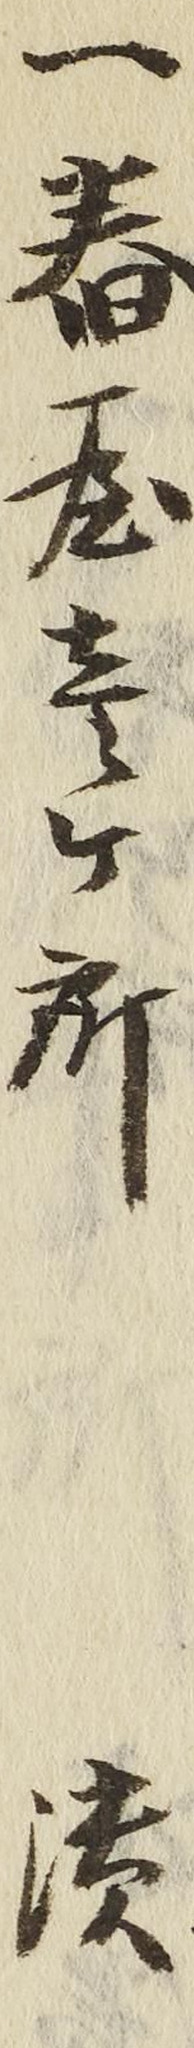一舂屋壱ヶ所潰
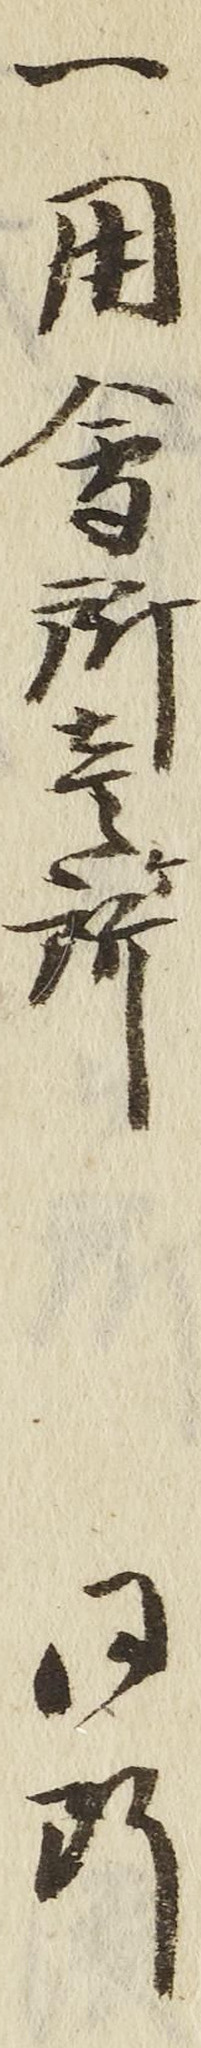一用会所壱ヶ所同断
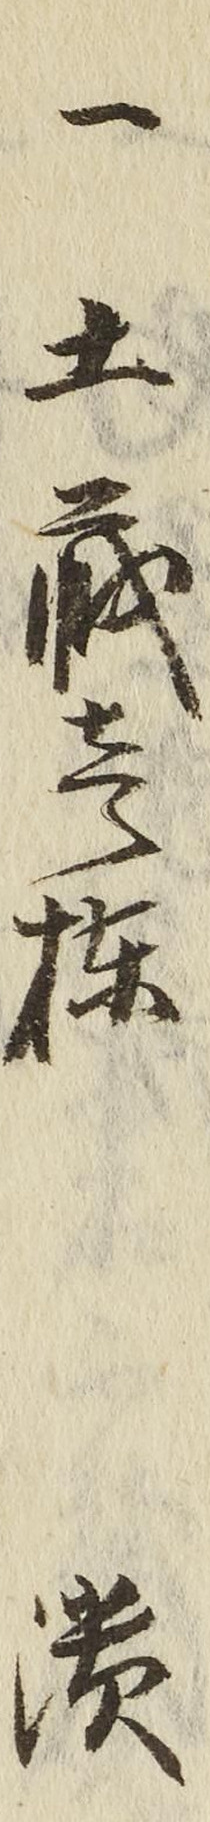一土蔵壱棟潰
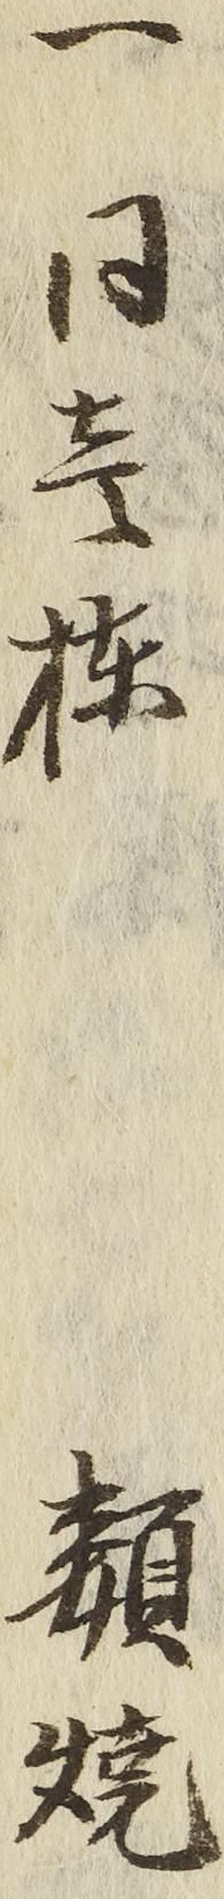一同壱棟類焼
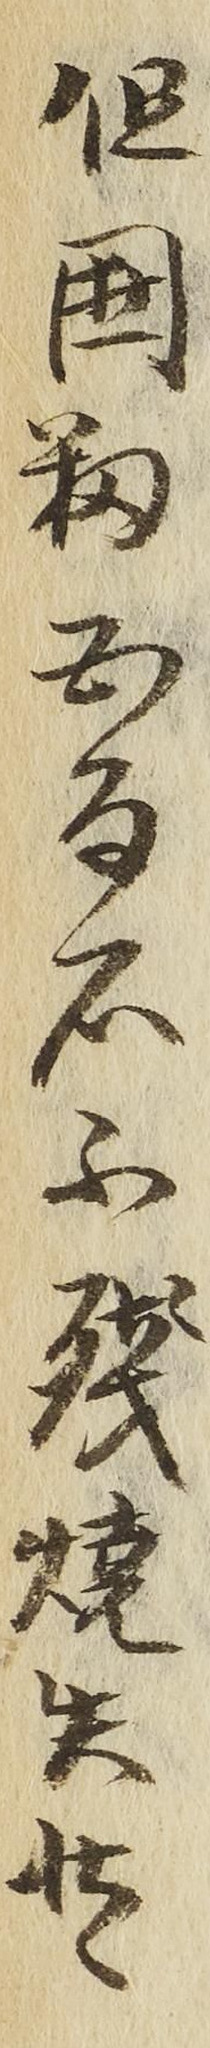但囲籾五百石不残焼失仕候

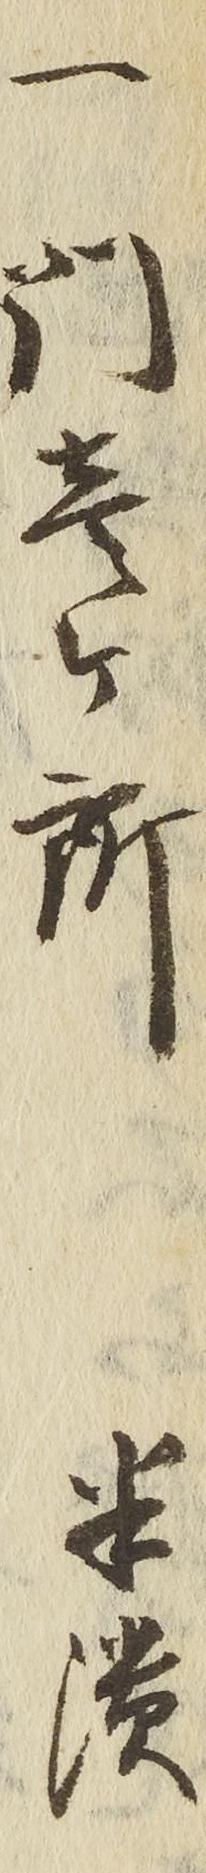一門壱ヶ所半潰
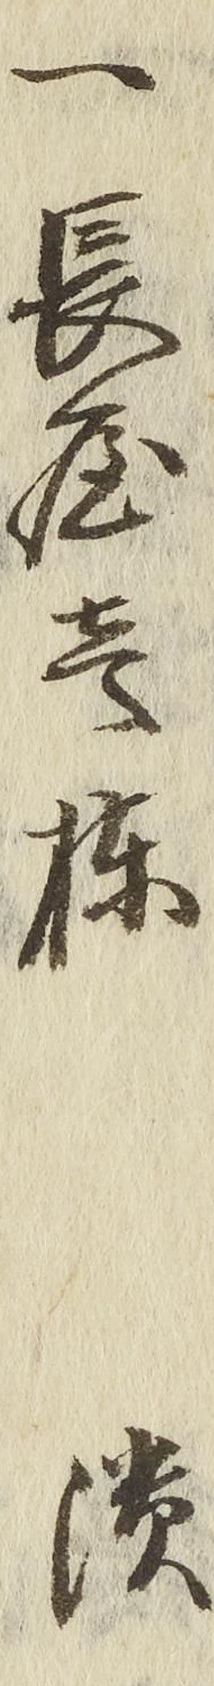一長屋壱棟潰
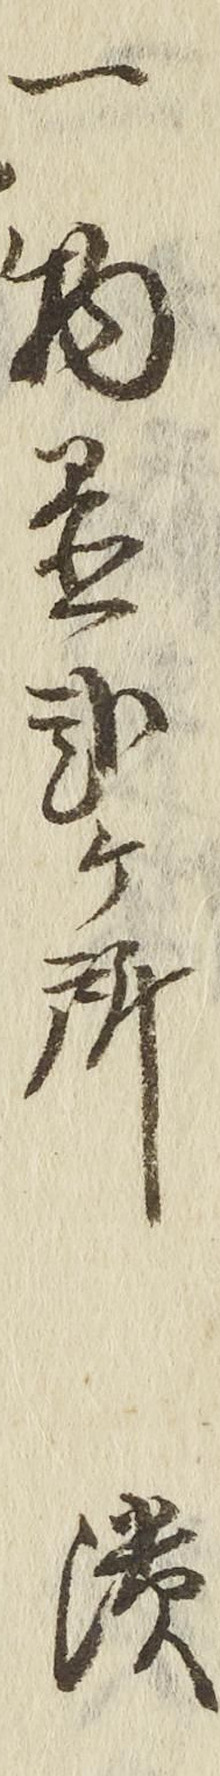一物置弐ヶ所潰
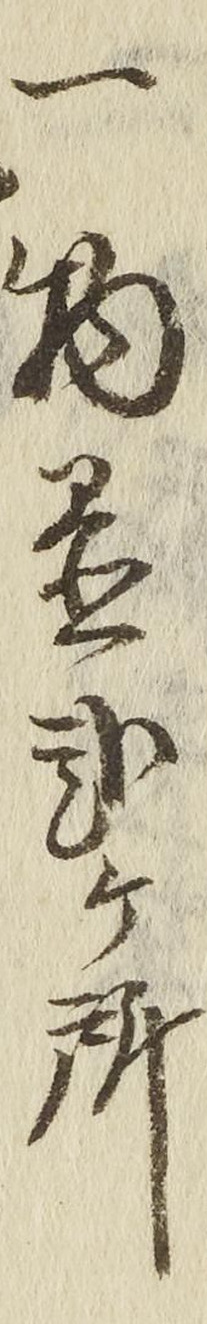一物置弐ヶ所潰
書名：信濃國大地震記　乾
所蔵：東京大学地震研究所図書室 Earthquake Research Institute Library, The University of Tokyo, JAPAN
